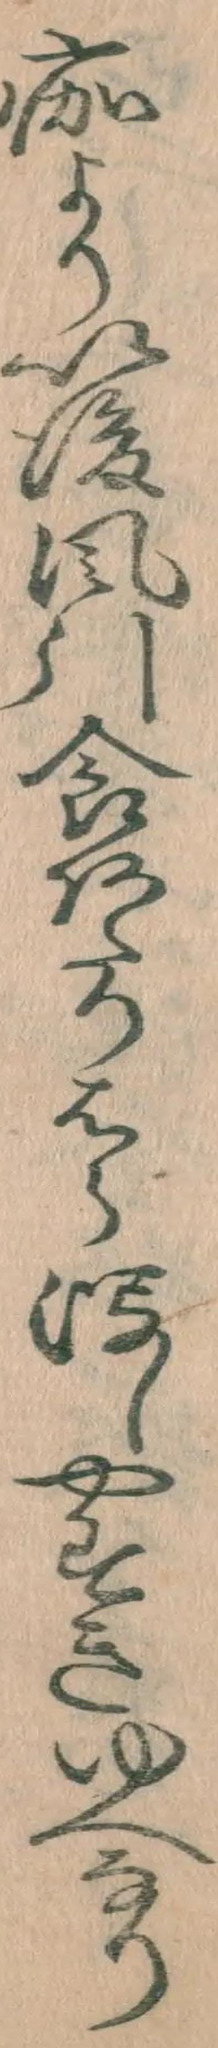痂より以後風引食あたりはら泻しやすきゆへなり
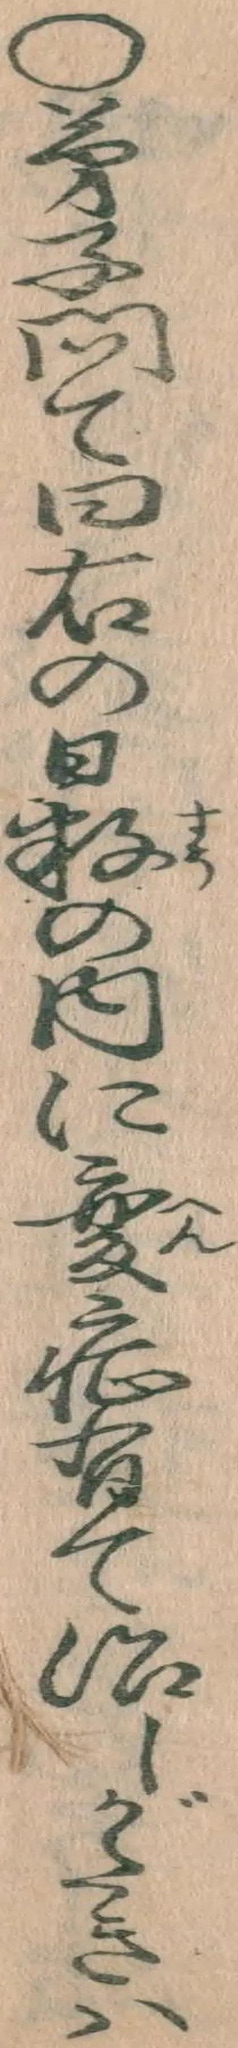○弟子問て曰右の日数の内に変症有て治しがたきは
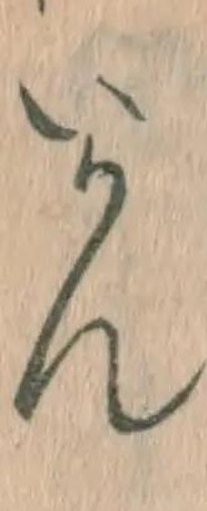いかん
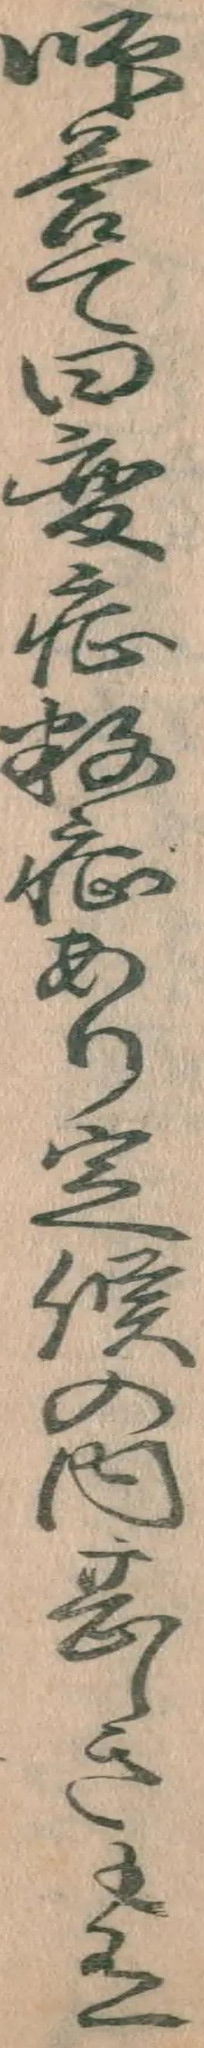師答て曰変症数症あり定候の内甚しきも有
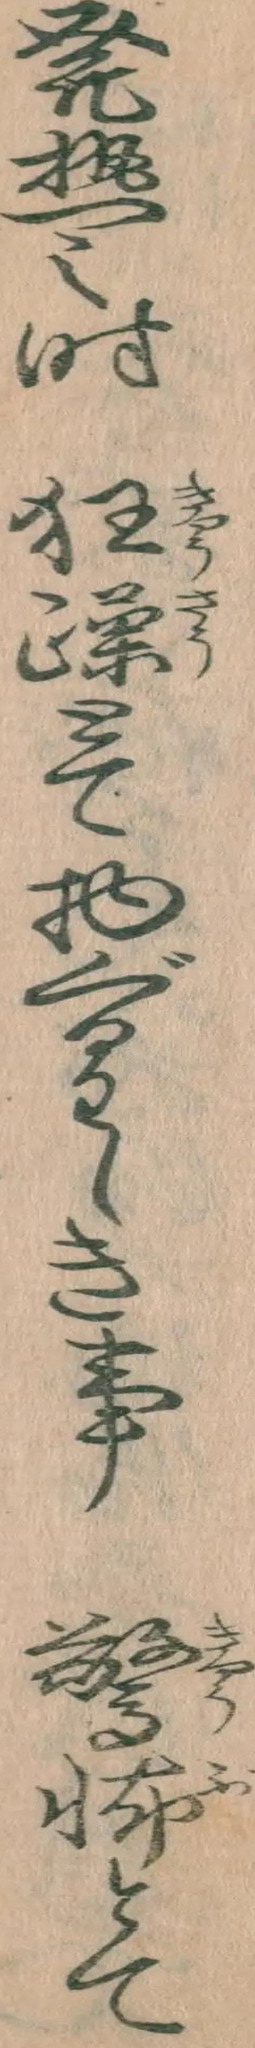発熱之時狂躁とて物ぐるわしき事驚怖とて
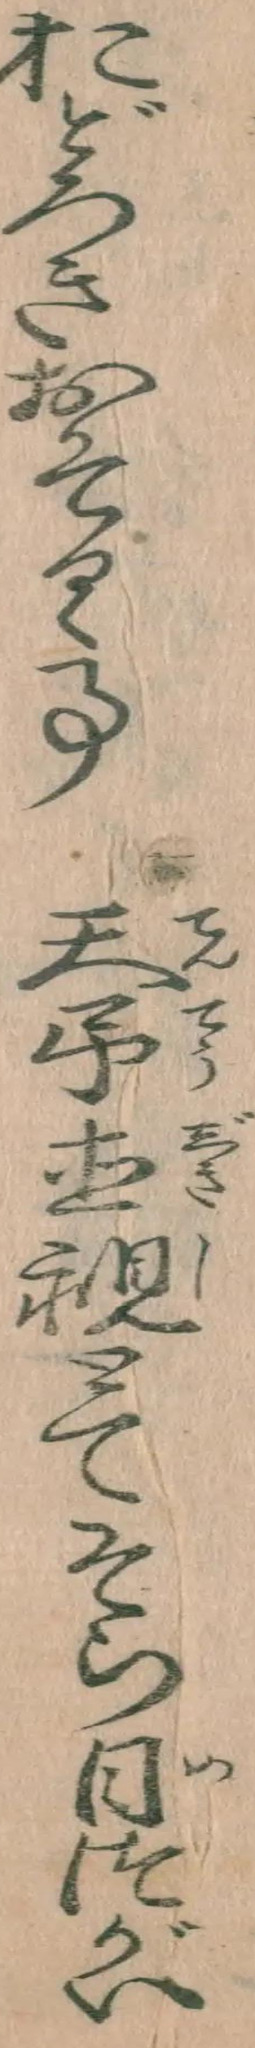おどろきおそるゝ事天弔直視とてそら目つがい
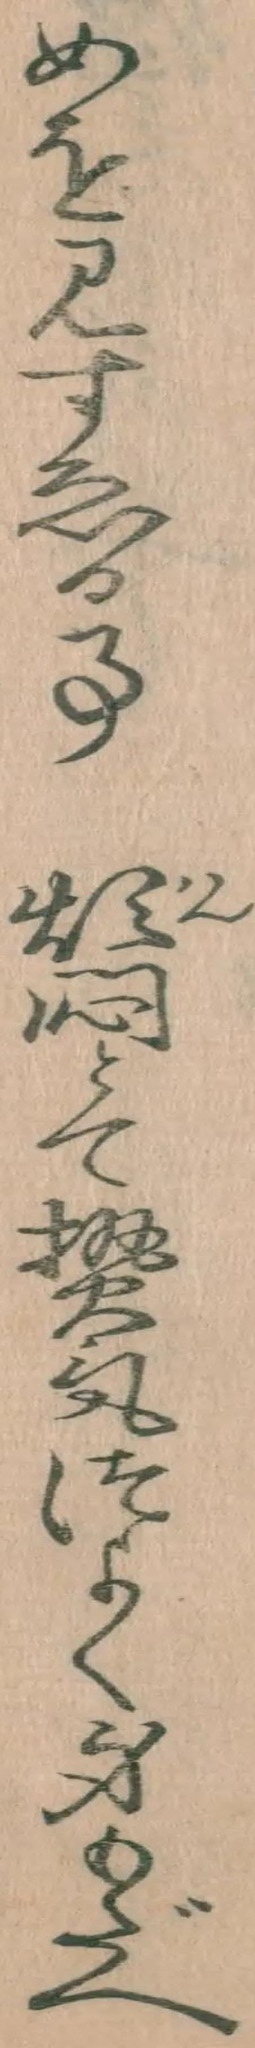めを見すゑる事煩悶とて熱気つよく身もだへ
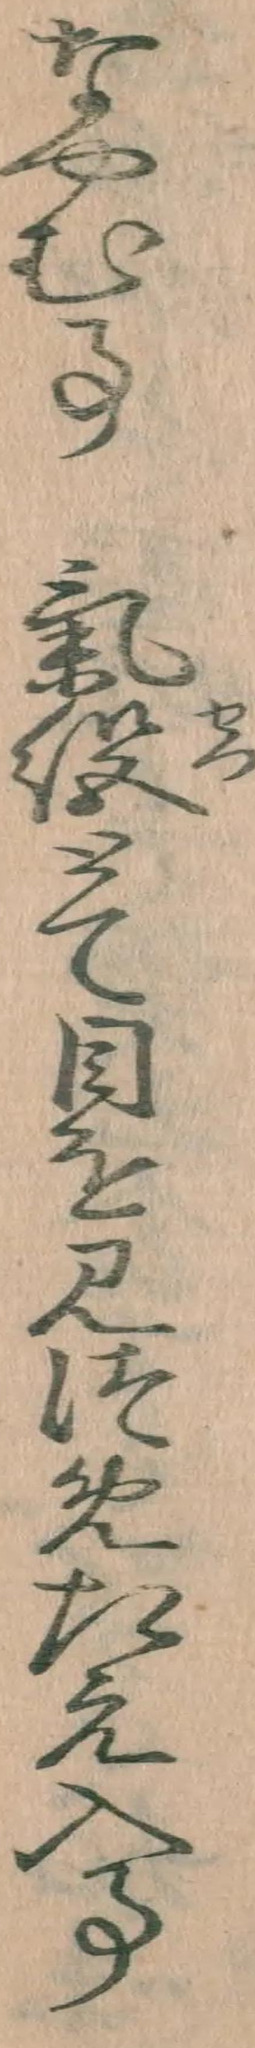なやむ事気絶とて目を見つめたえ入事
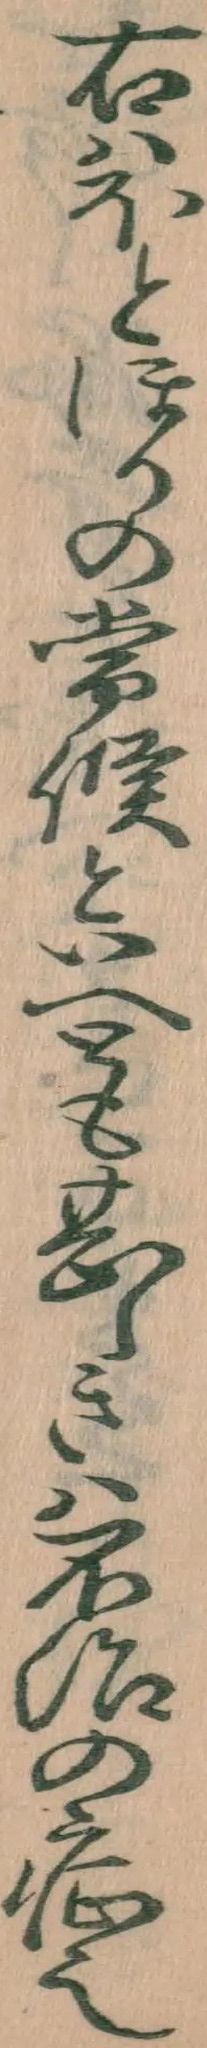右はほとほりの常候といへとも甚しきは不治の病也
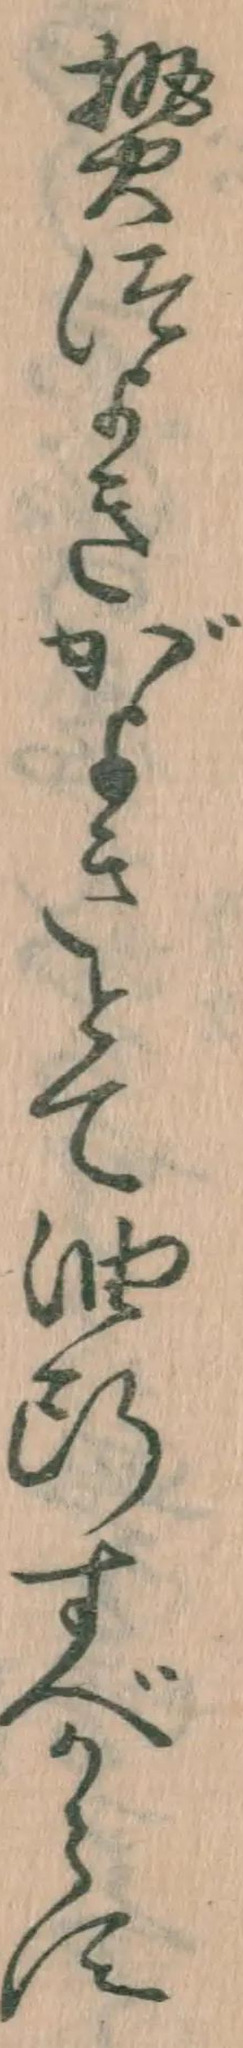熱つよきがよきとて油断すべからす
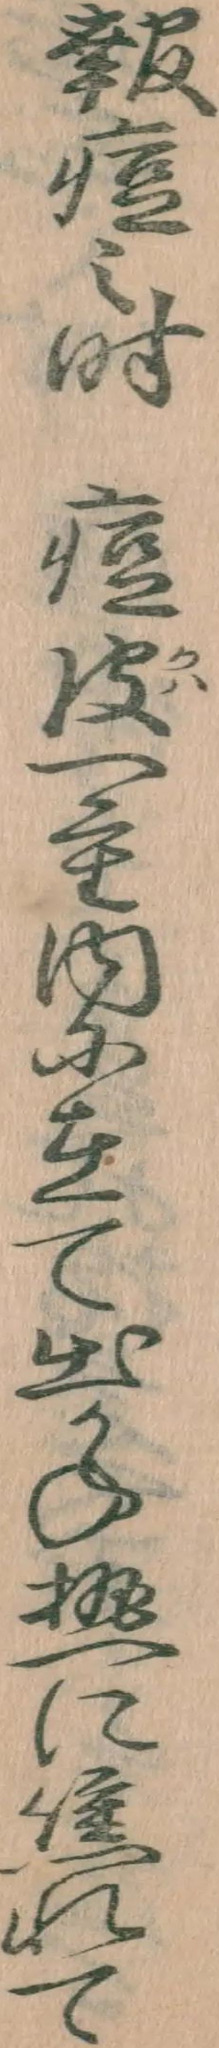報痘之時痘皮へ重内に在て出かね熱に焦れて
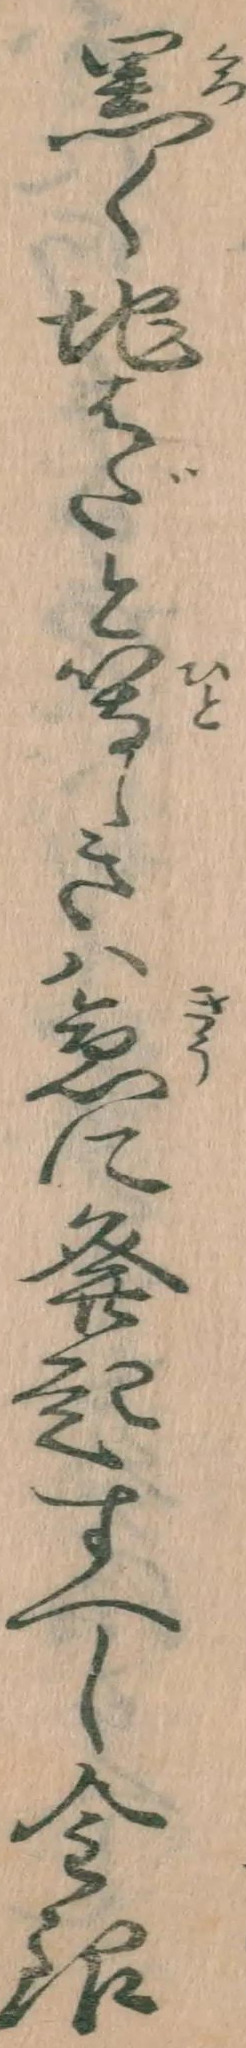黒く地はだと等しきは急に発起すへし金銀
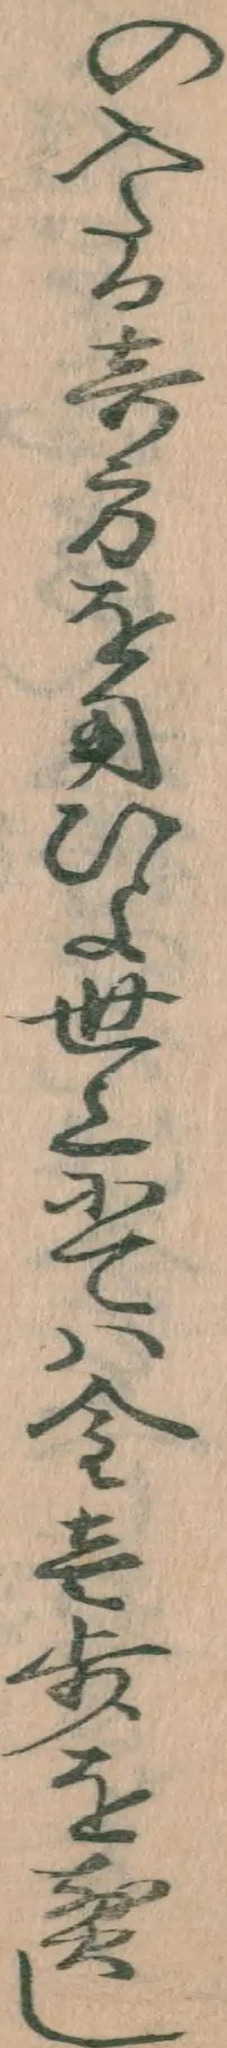の入たる奇方を用ひよ世上にては金壱歩を煎し
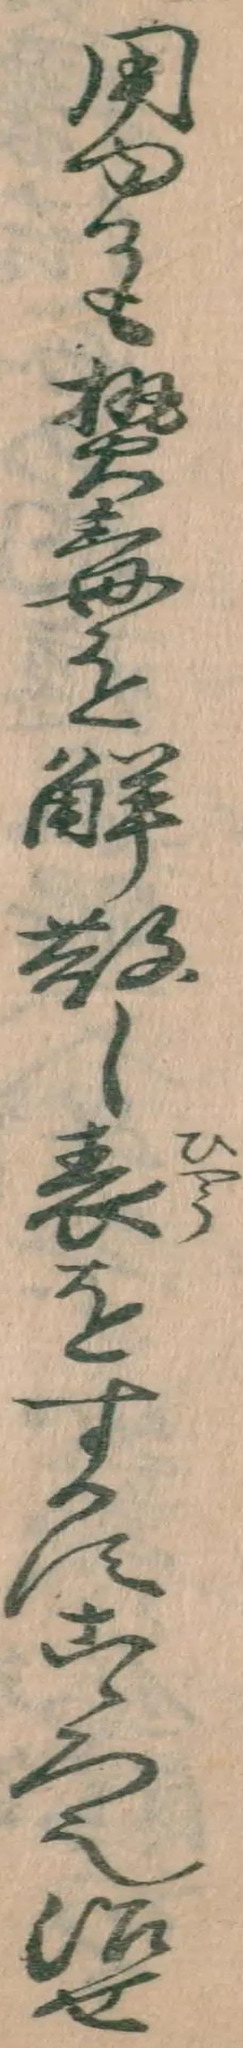用ゆるも熱毒を解し表をすかすこゝろ也治せ
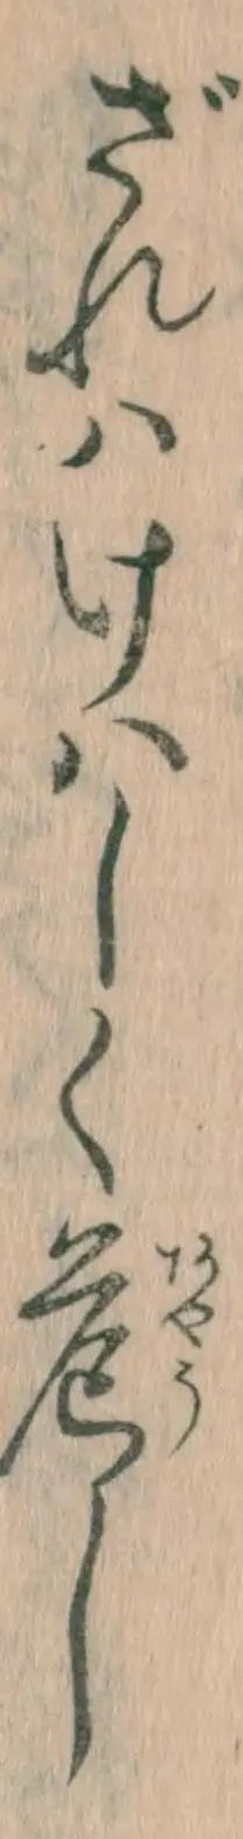ざれはけはしく危し
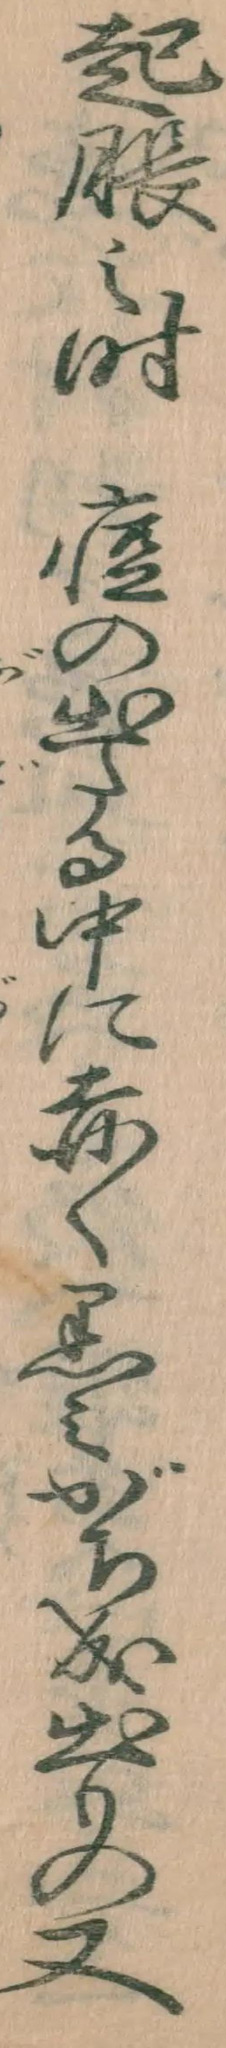起脹之時痘の出たる中に赤く黒みがち成出もの又
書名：痘家初心問答
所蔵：国立国会図書館 National Diet Library, JAPAN
